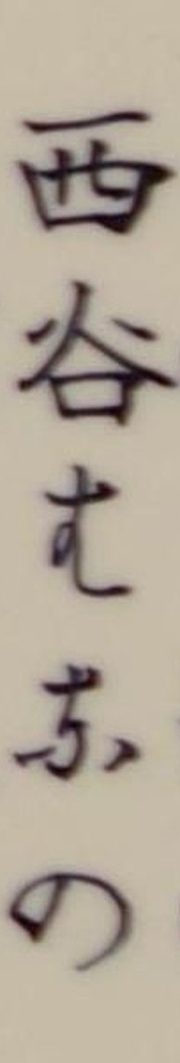西谷はなの
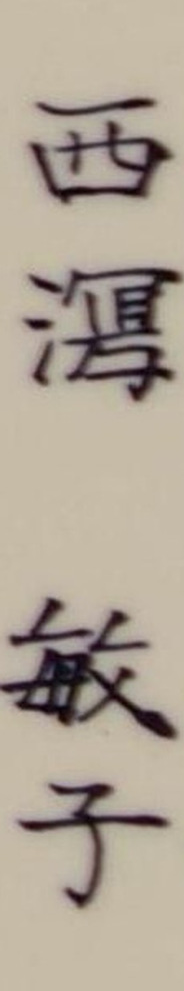西潟敏子
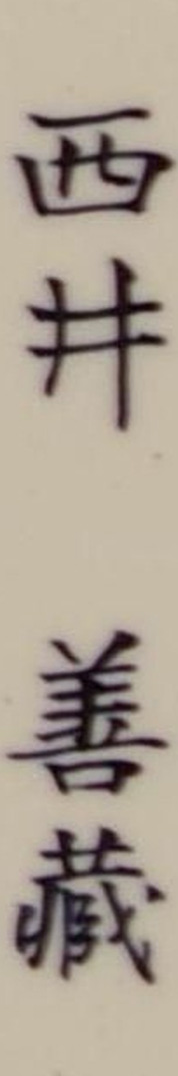西井善蔵
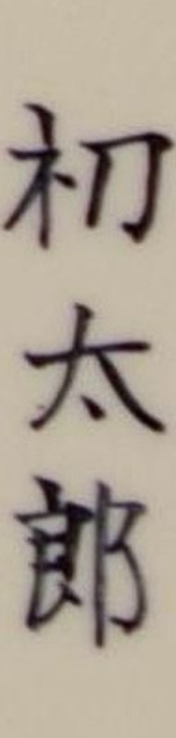初太郎
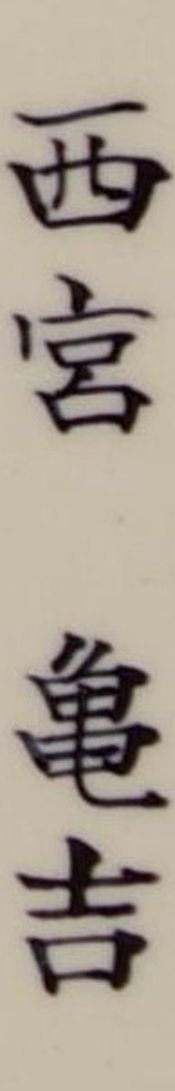西宮亀吉
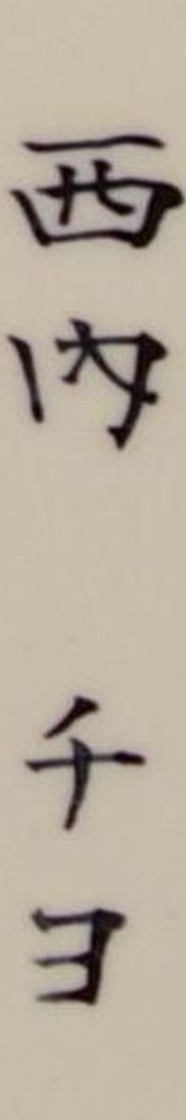西内チヨ
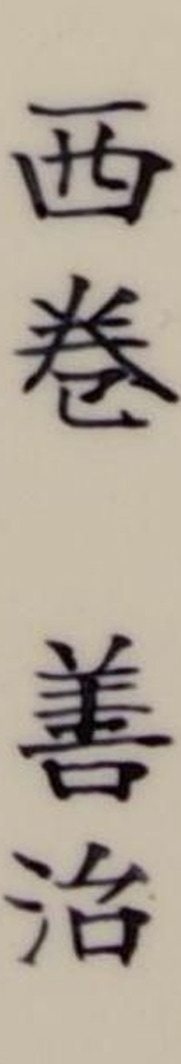西巻善治
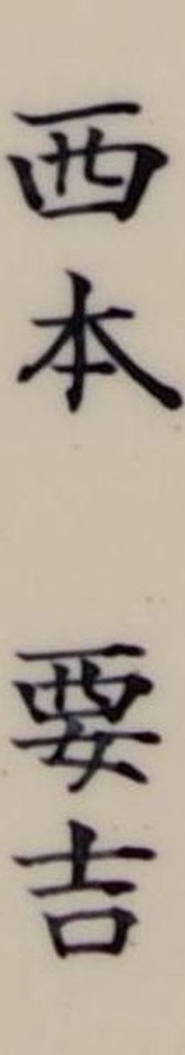西本要吉
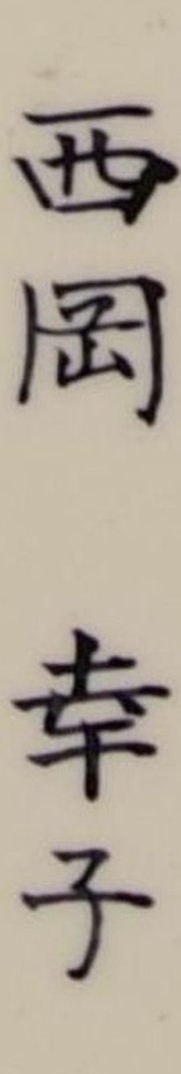西岡幸子
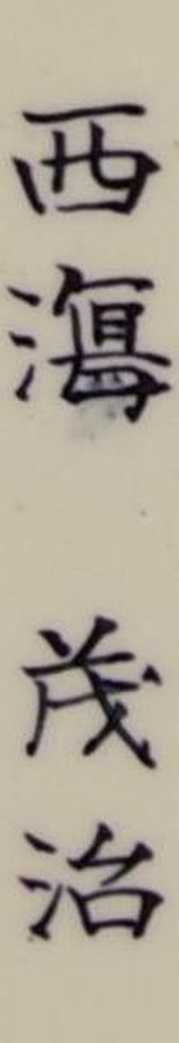西海茂治
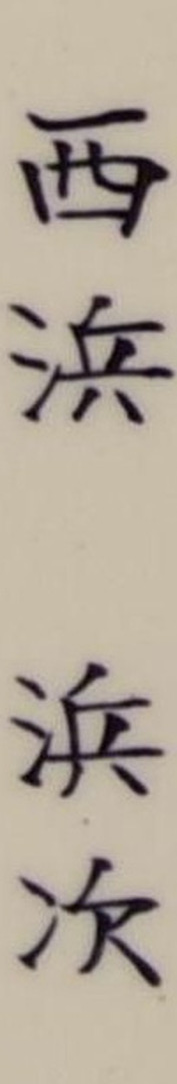西浜近次
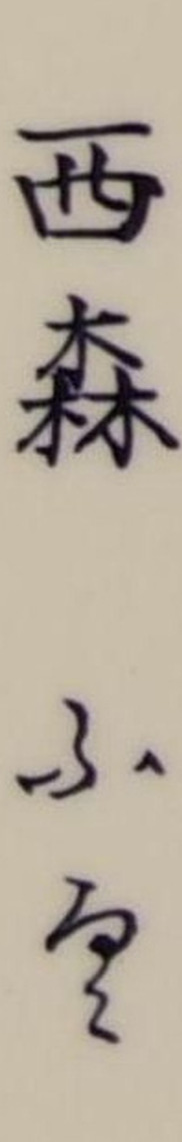西森ふく
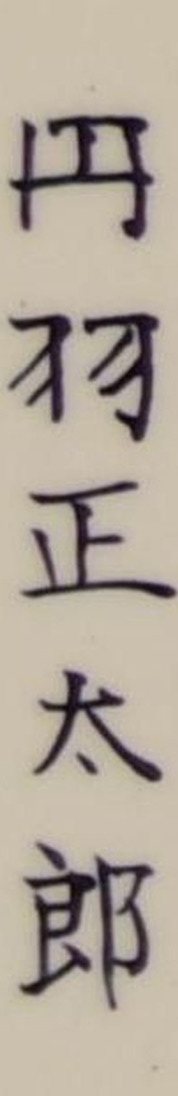円羽正太郎

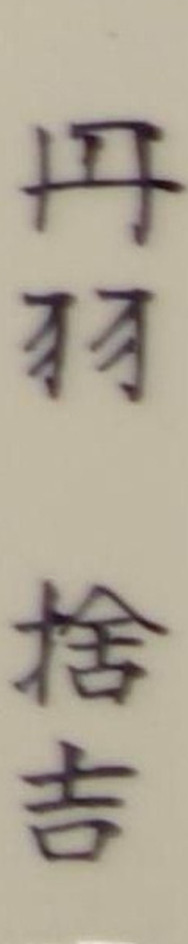丹羽捨吉
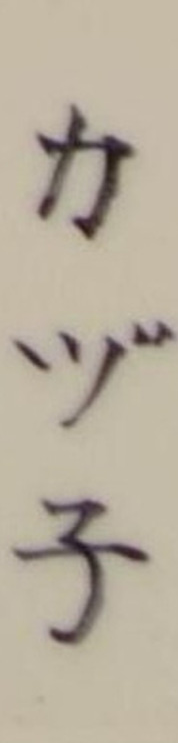カヅ子
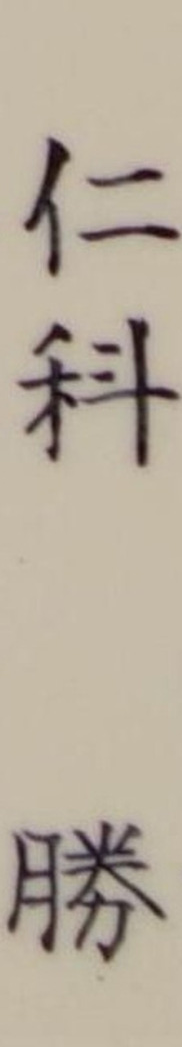仁科勝
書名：M~S
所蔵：高野山金剛峯寺
